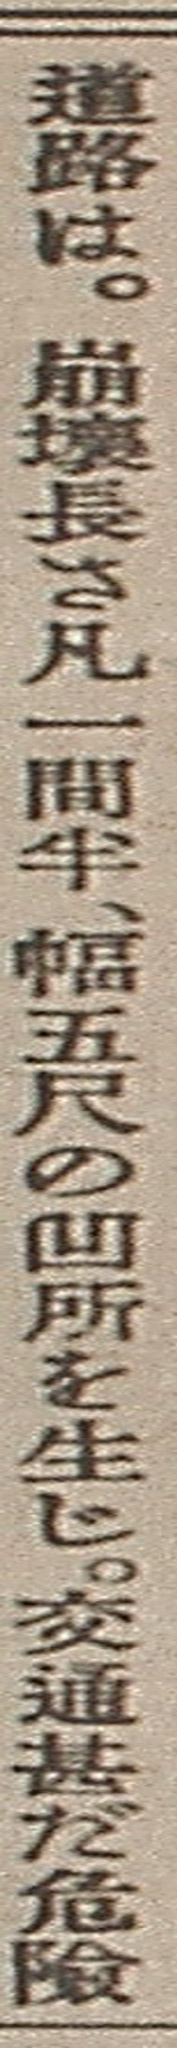道路は。崩壊長さ凡一間半、幅五尺の凹所を生じ。交通甚だ危険
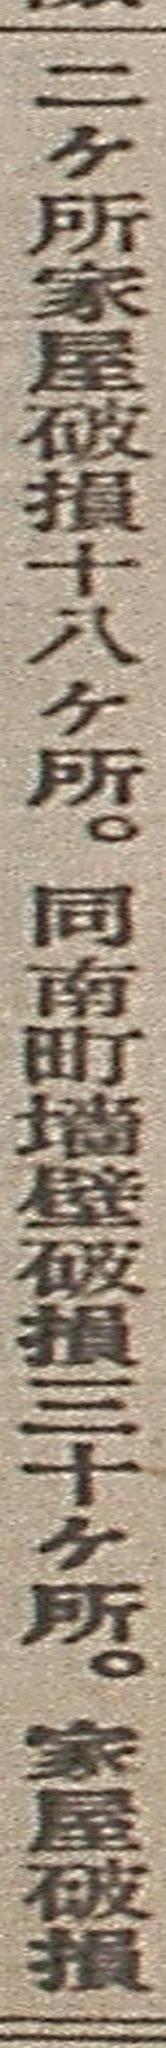二ケ所家屋破損十八ケ所。同南町墻壁破損三十ケ所。家屋破損
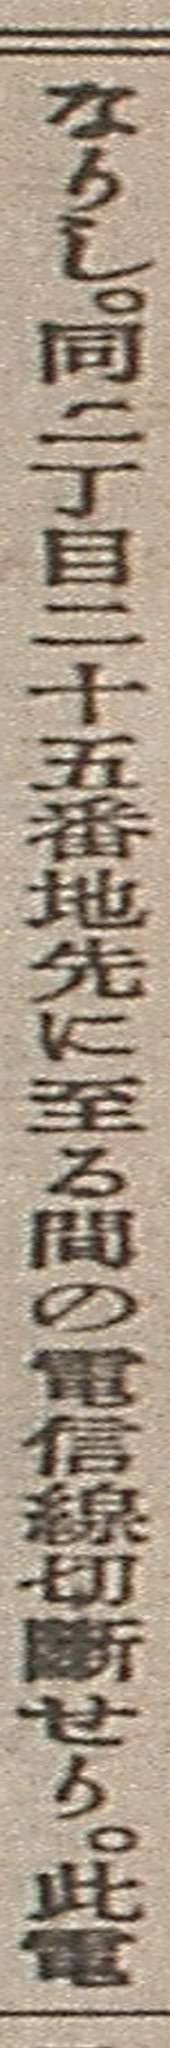なりし。同二丁目二十五番地先に至る間の電信線切断せり。此電
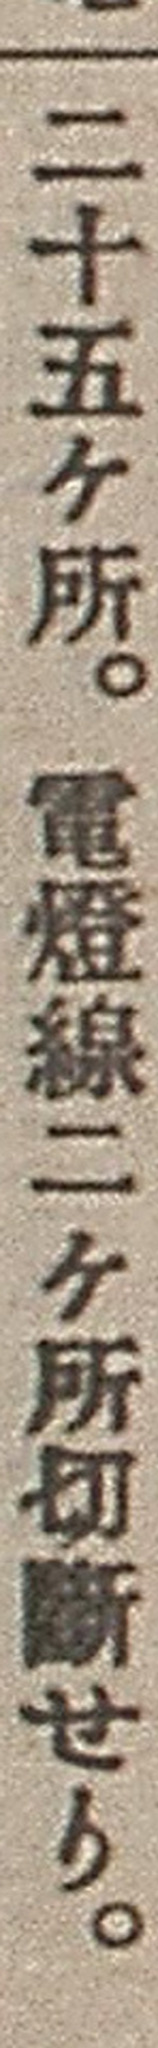二十五ケ所。電燈線二ケ所切断せり。
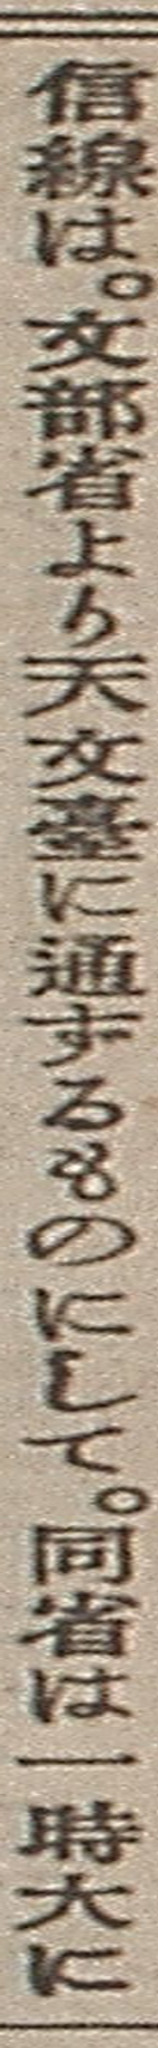信線は。文部省より天文台に通ずるものにして。同省は一時大に
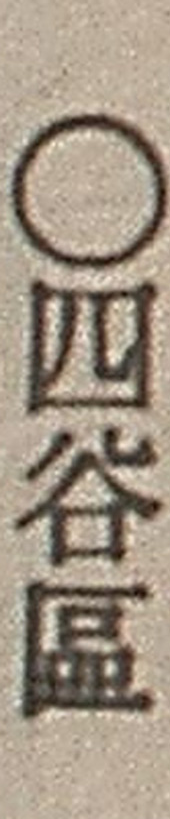〇四谷区
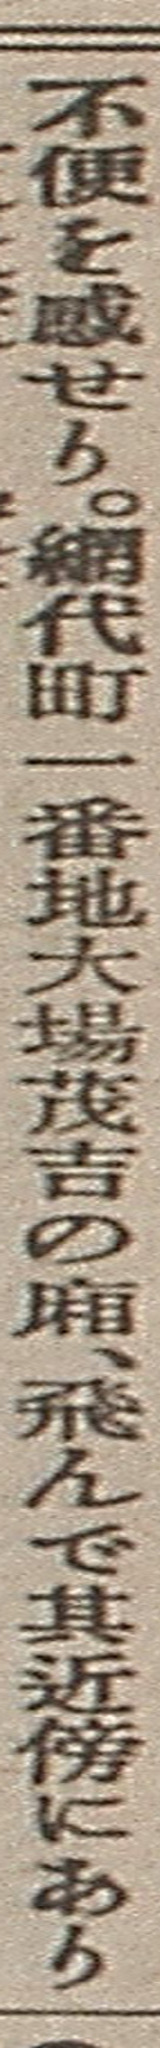不便を感せり。網代町一番地大場茂吉の廂、飛んで其近傍にあり
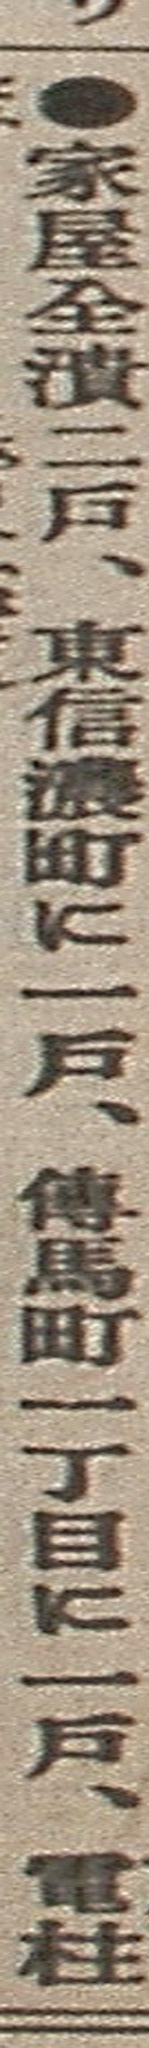●家屋全潰二戸、東信濃町に一戸、傳馬町一丁目に一戸、電柱
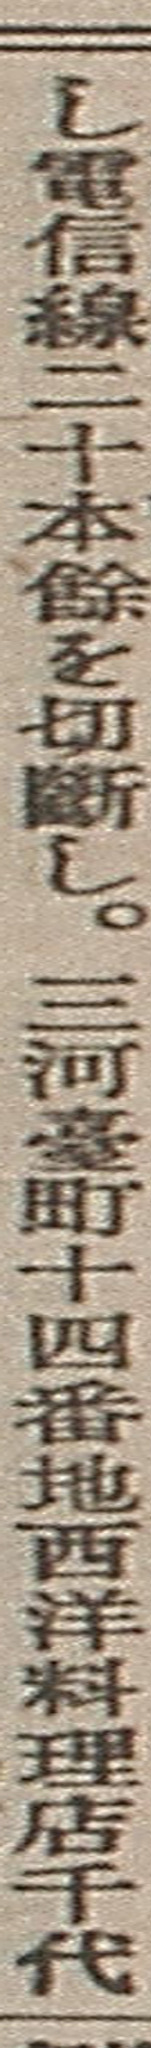し電信線二十本余を切断し。三河台町十四番地西洋料理店千代
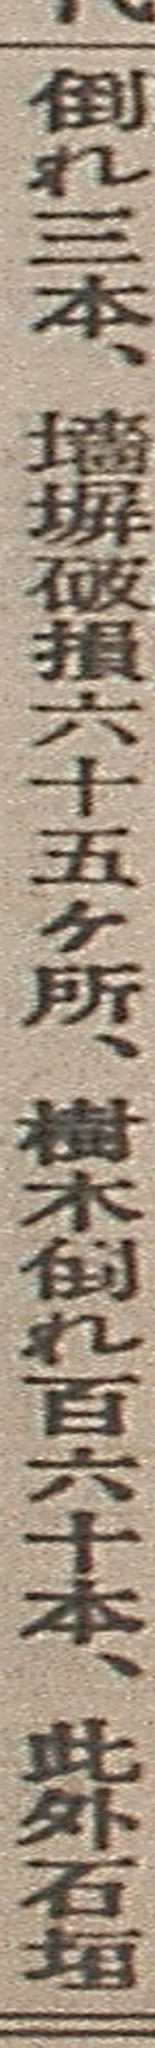倒れ三本、墻塀破損六十五ケ所、樹木倒れ百六十本、此外石垣
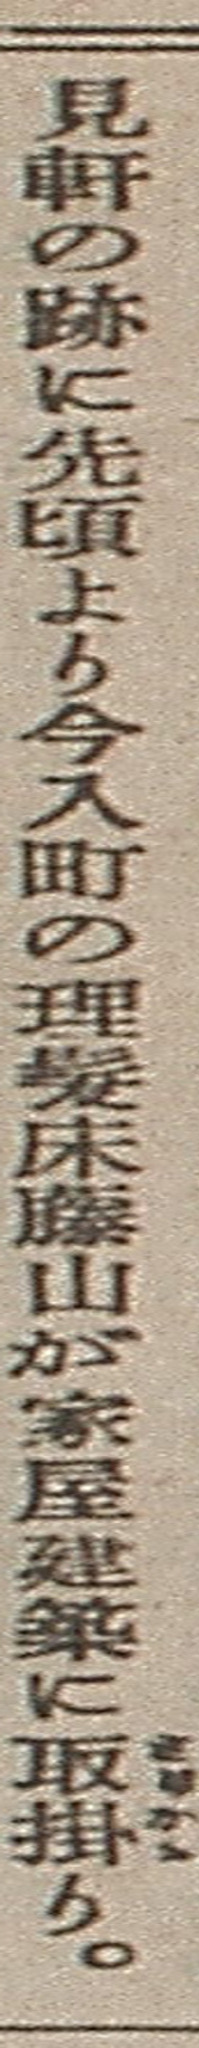見軒の跡に先頃より今入町の理髪床藤山が家屋建築に取掛り。
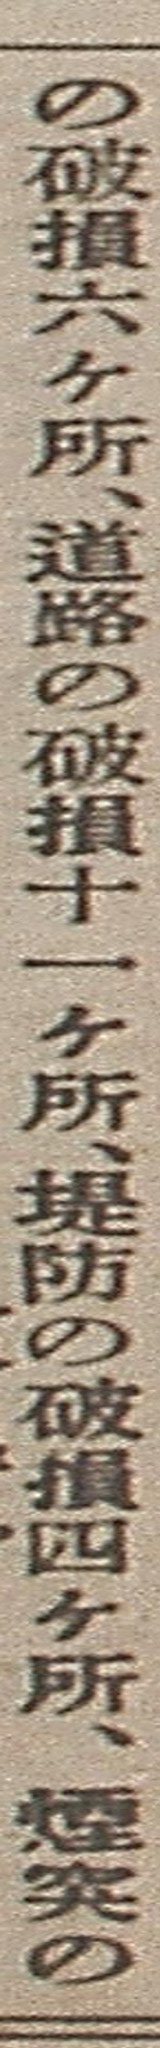の破損六ケ所、道路の破損十一ケ所、堤防の破損四ケ所、煙突の
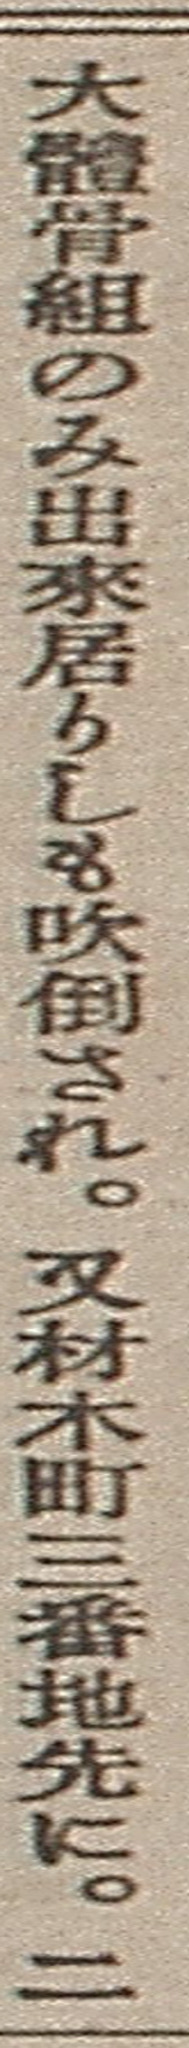大体骨組のみ出来居りしも吹倒され。又材木町三番地先に。二
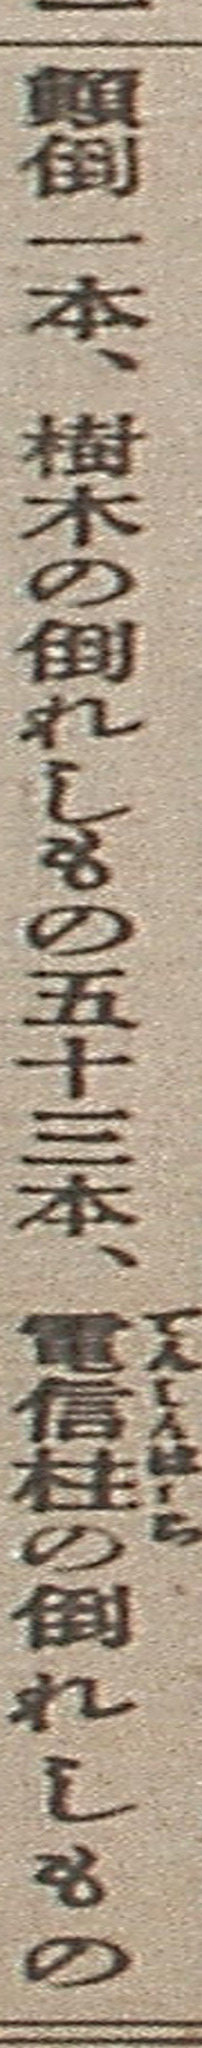顛倒一本、樹木の倒れしもの五十三本、電信柱の倒れしもの
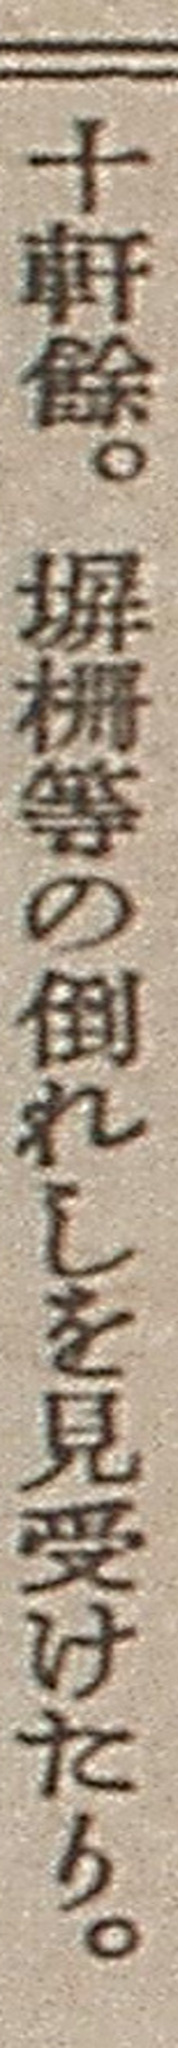十軒余。塀柵等の倒れしを見受けたり。
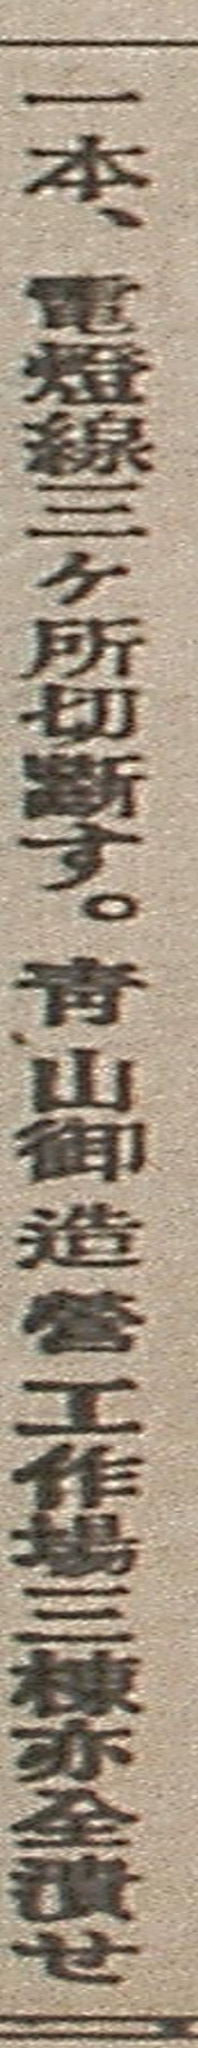一本、電燈線三ケ所切断す。青山御造営工作場三棟亦全潰せ
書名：風俗畫報臨時増刊第百九十九號　明治三十二年十月各地災害圖會（前編之續）
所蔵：東京大学地震研究所図書室 Earthquake Research Institute Library, The University of Tokyo, JAPAN
